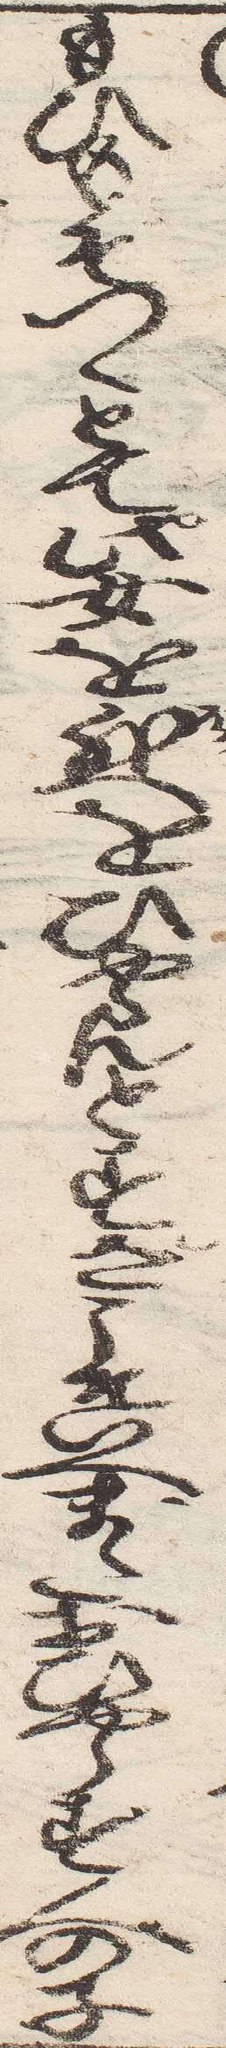もひもぞつくとて。此女を外へをひやらんとす。さこそいへまたおひやらす人の子
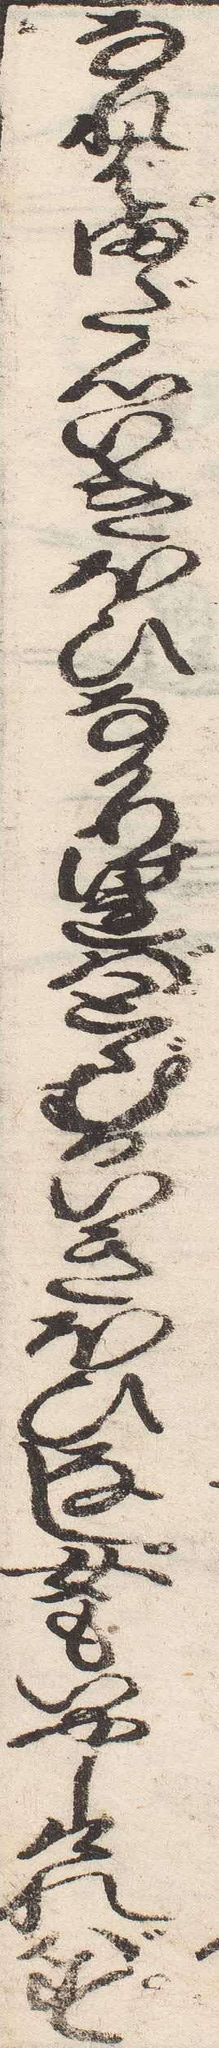なれば。まだ心いきほひなかりければ。とゞむるいきほひなし。女もいやしければ。す
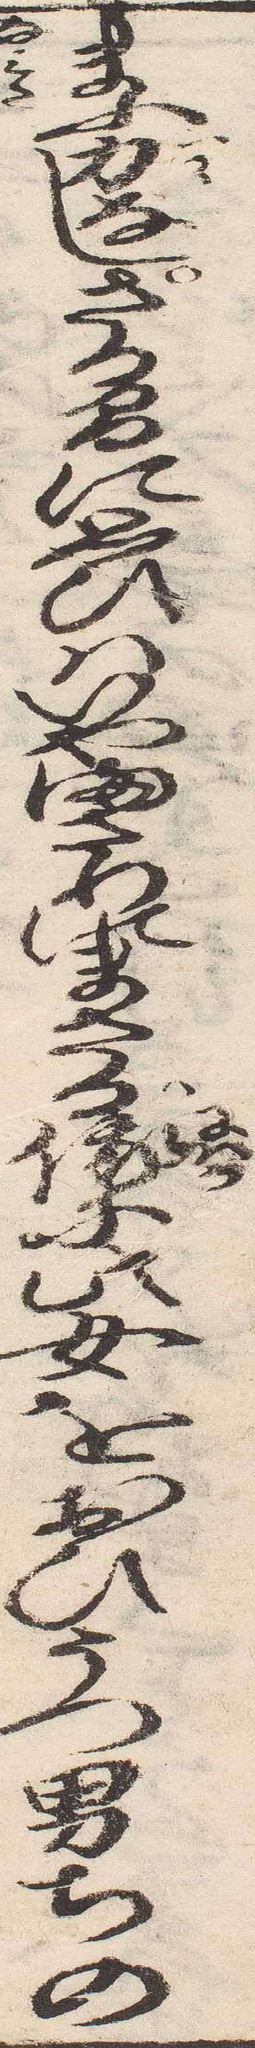まふ力なし。さる間に思ひはいやまさりにまさる。俄に此女をおひうつ男ちの
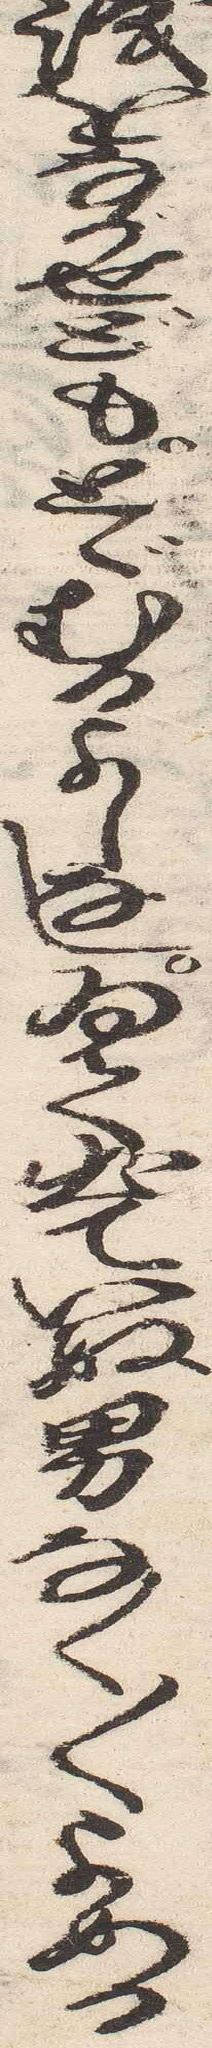涙をながせども。とゞむるよしなし。ゐて出ていぬ男なく〳〵よめる
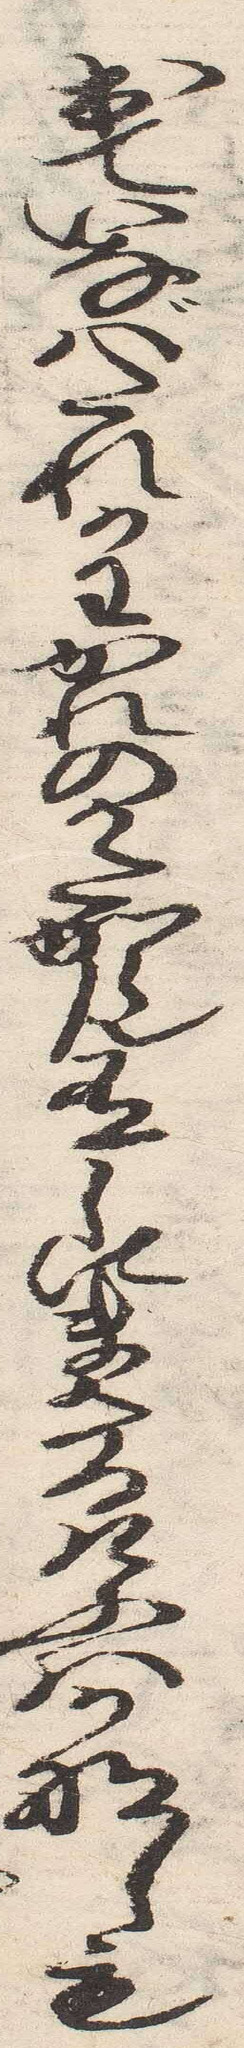出ていなばたれかわかれのかたからん有しにまさるけふはかなしも
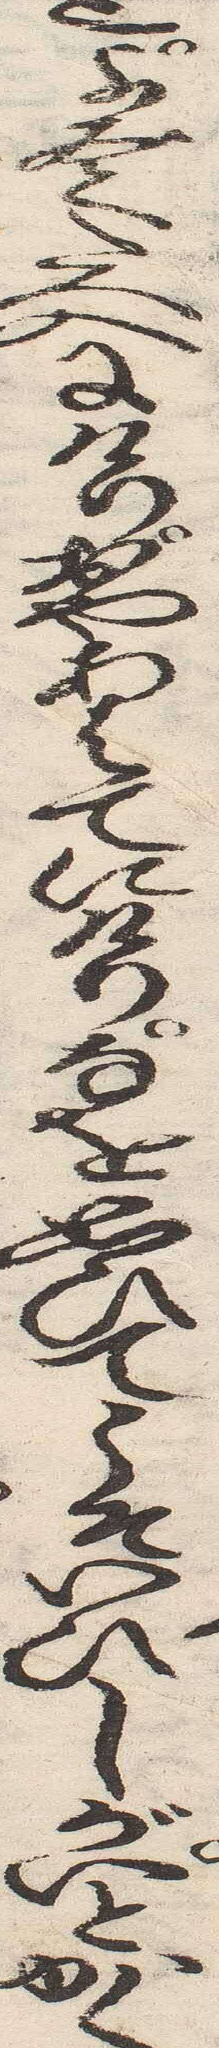と。よみてたへ入にけり。おやあはてにけり。なを思ひてこそいひしが。いとかく
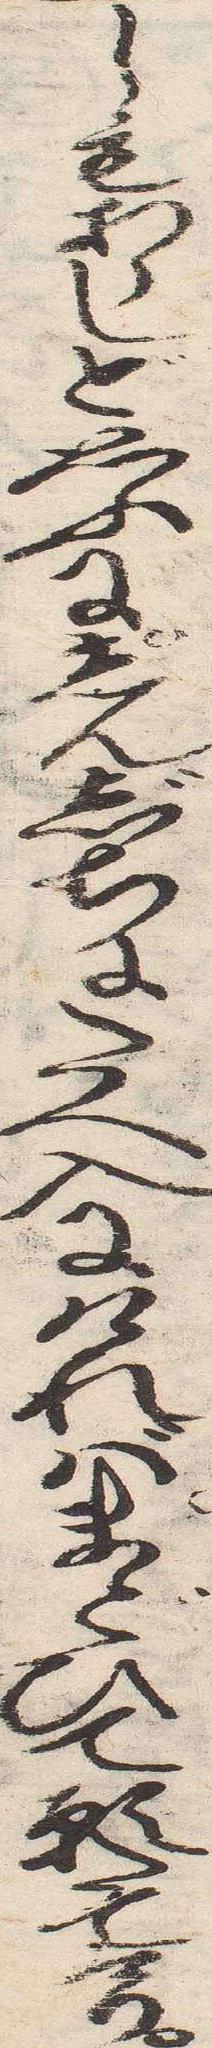しもあらし。と思ふに。しんじちにたへ入にければ。まどひて願たてけり。
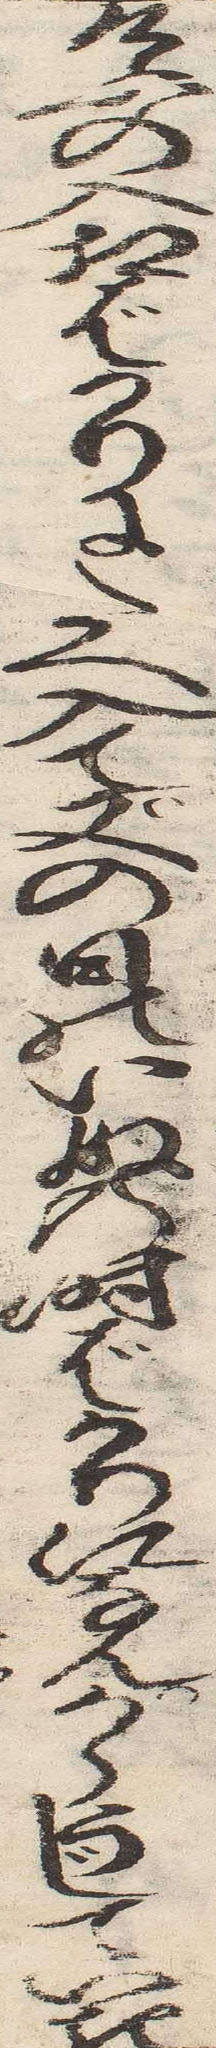けふの入相ばかりにたへ入て。又の日のいぬの時ばかりになん。からうじていき
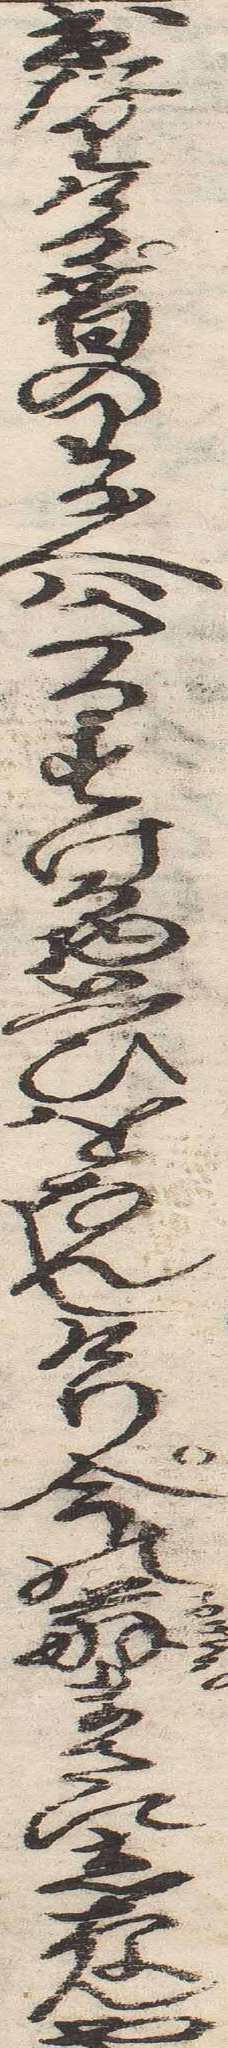出たりける。昔の若人はさるすける物思ひをなんしけり。今の翁まさにしなんや
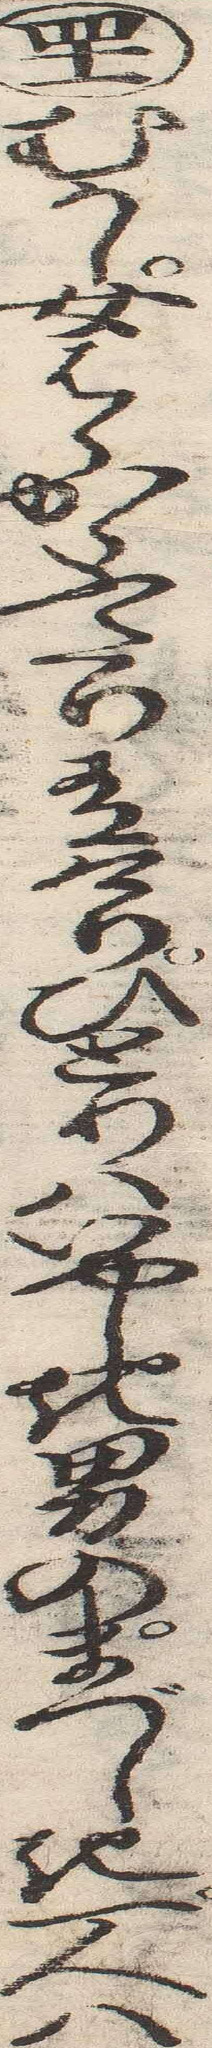四十一むかし。女はらからふたり有けり。ひとりはいやしき男の。まづしき。一人は
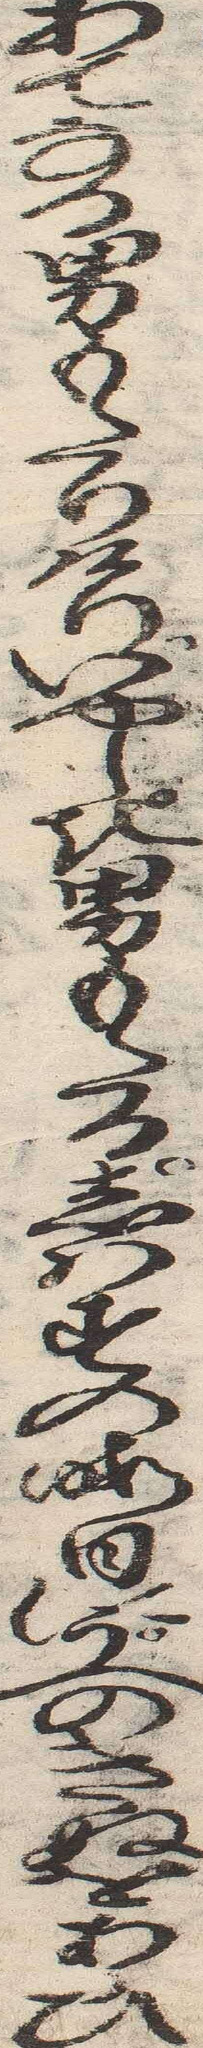あてなる男もたりけり。いやしき男もたる。しはすの晦日に。うへのきぬをあらひ
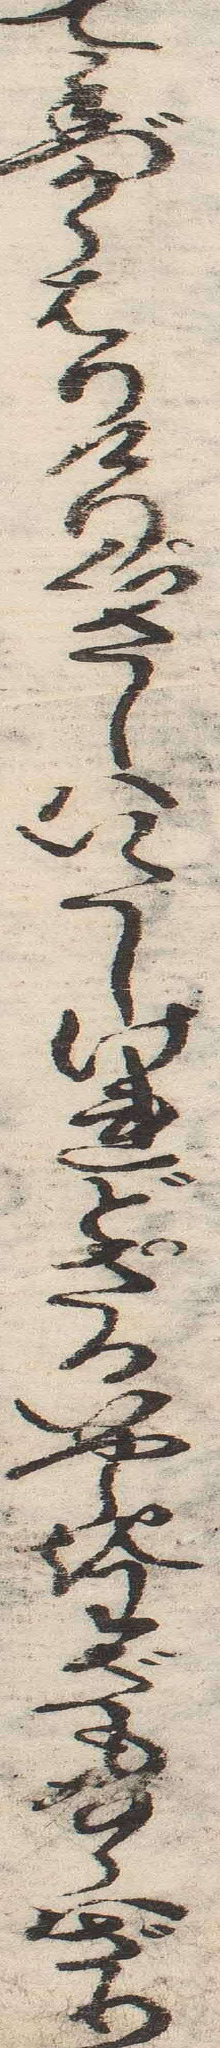て手づからはりけり。心さしはいたしけれど。さるいやしきわざもならはざり
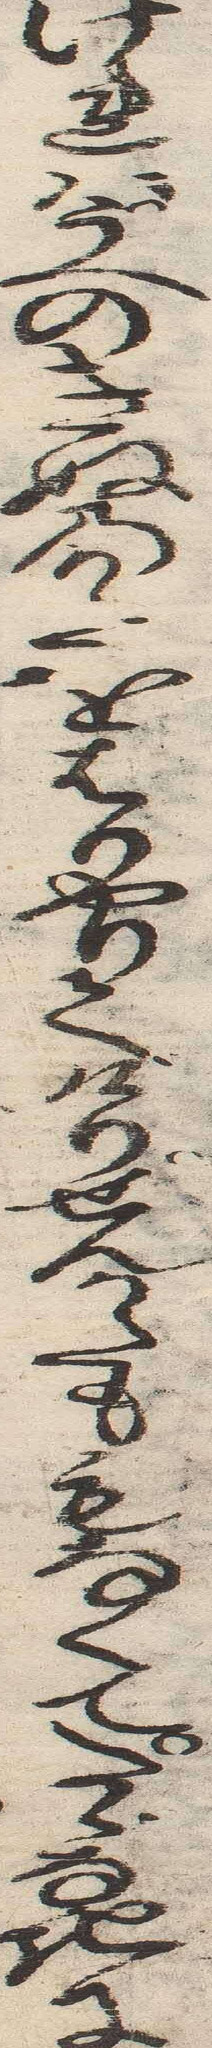けれは。うへのきぬのかたをはりやりてけり。せんかたももなくて。たゞなきに
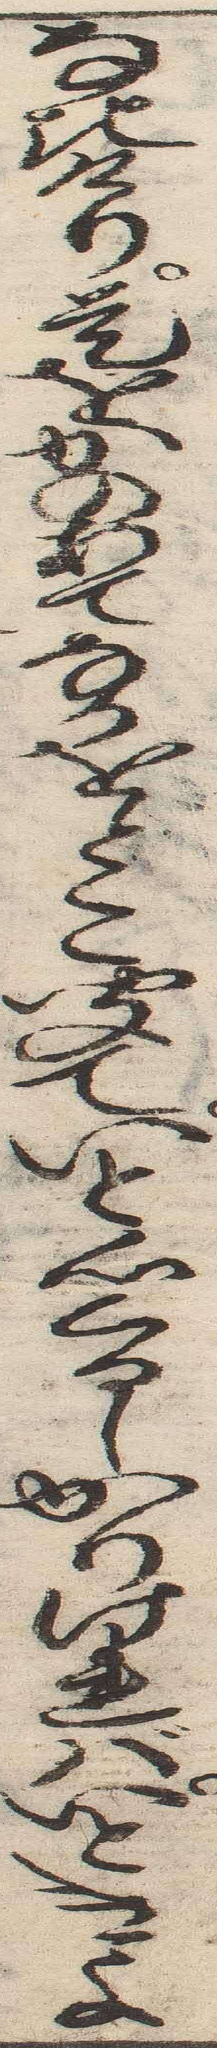なきけり。是をかのあてなるをとこ聞て。いと心くるしかりければ。いときよ
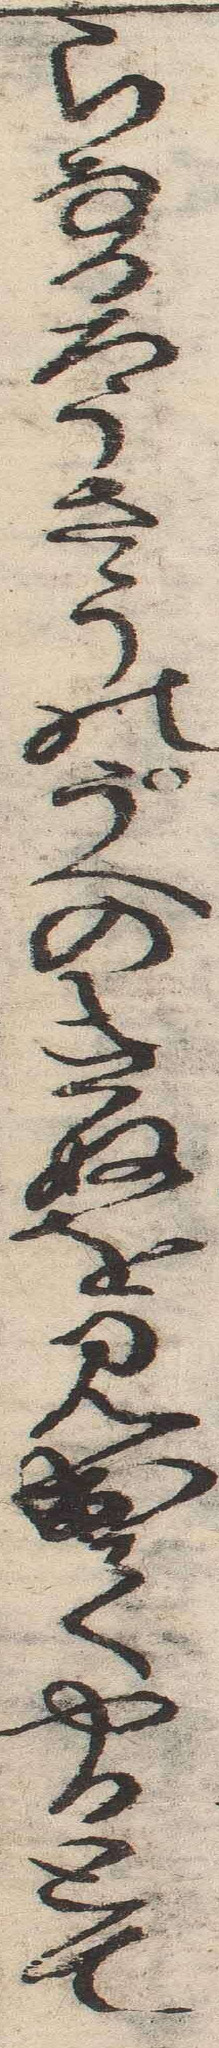らなるろうさうの。うへのきぬを見出てやるとて

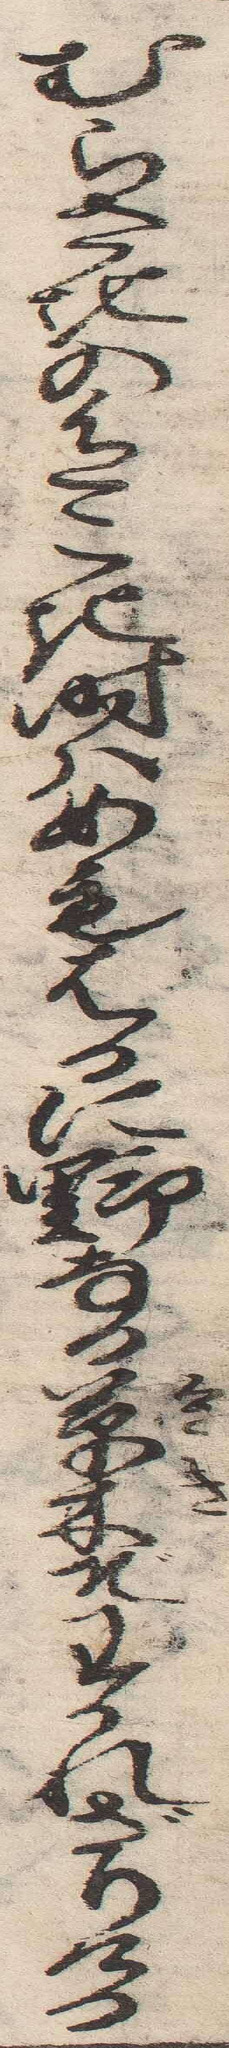古今むらさきの色こき時はめもはるに野なる草木ぞわかれざりける
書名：伊勢物語
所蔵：東京学芸大学附属図書館 国文学研究資料館
